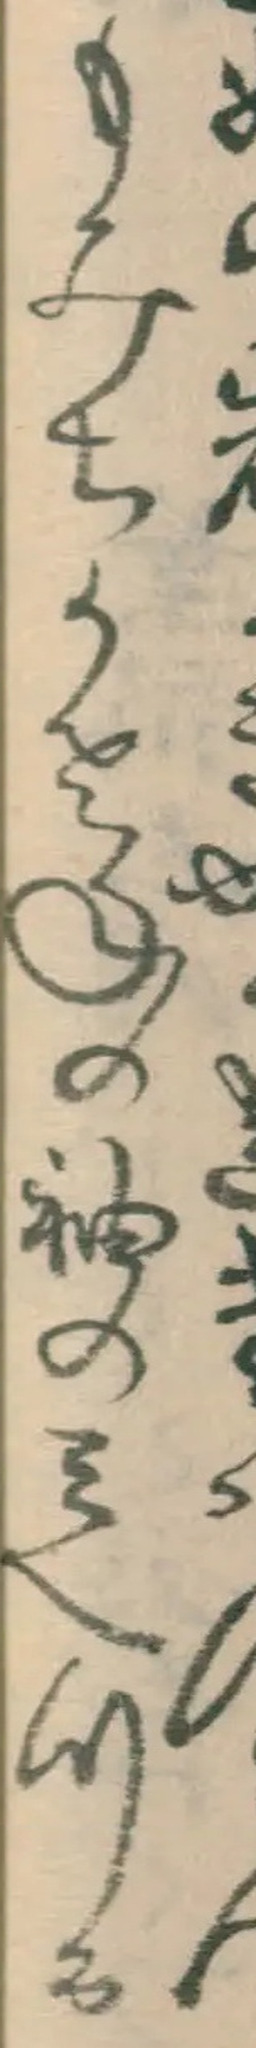もみちかさねの袖のみへつる
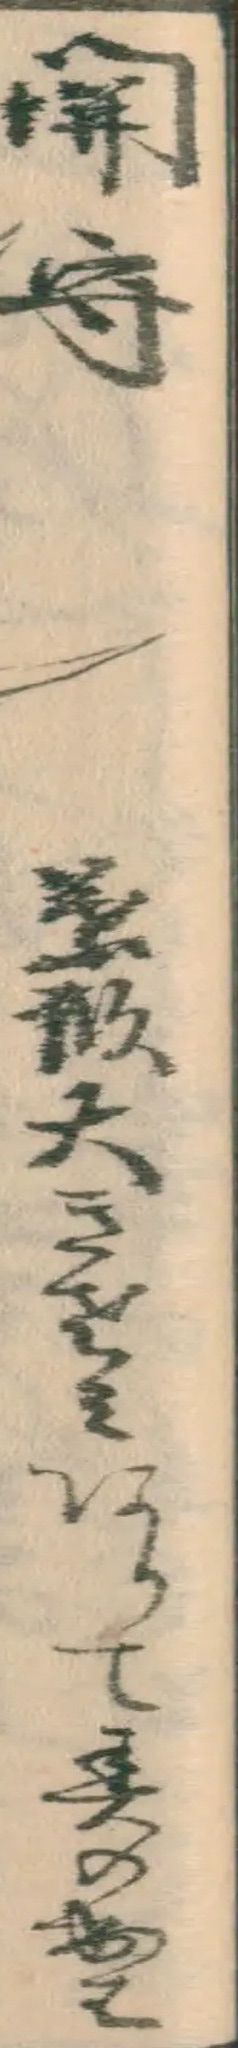関守葉形大きさみありて春の出は
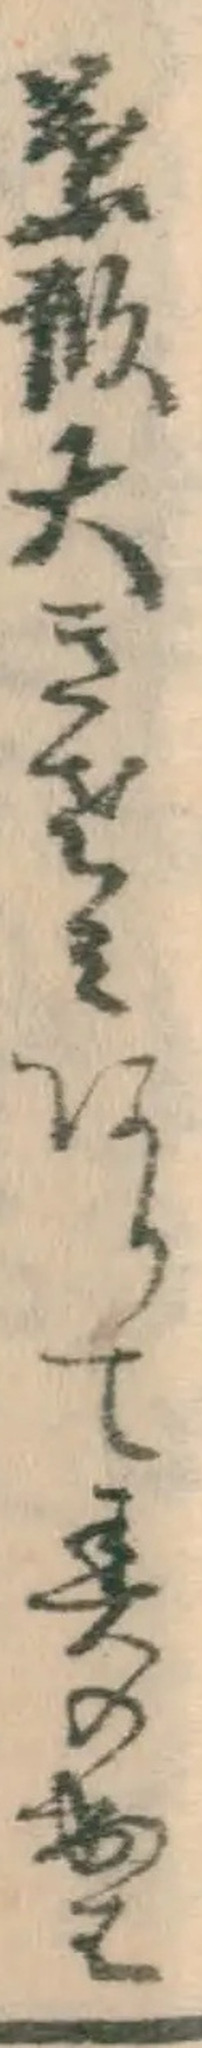関守葉形大きさみありて春の出は
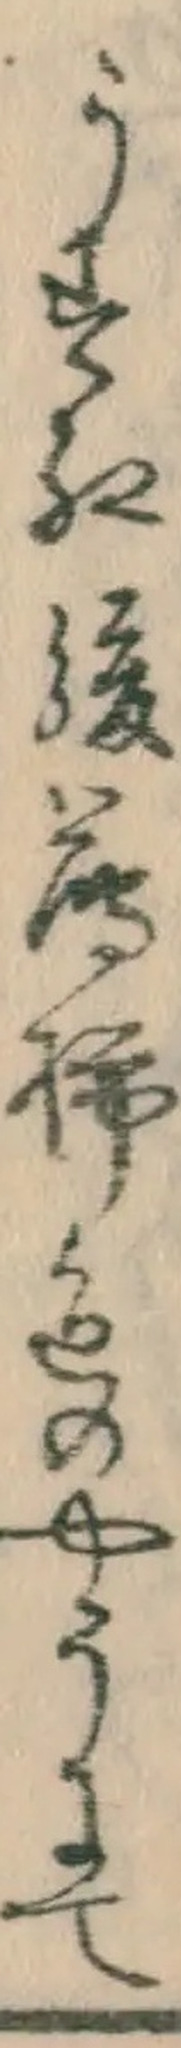うす紅後薄柿色のやうにて
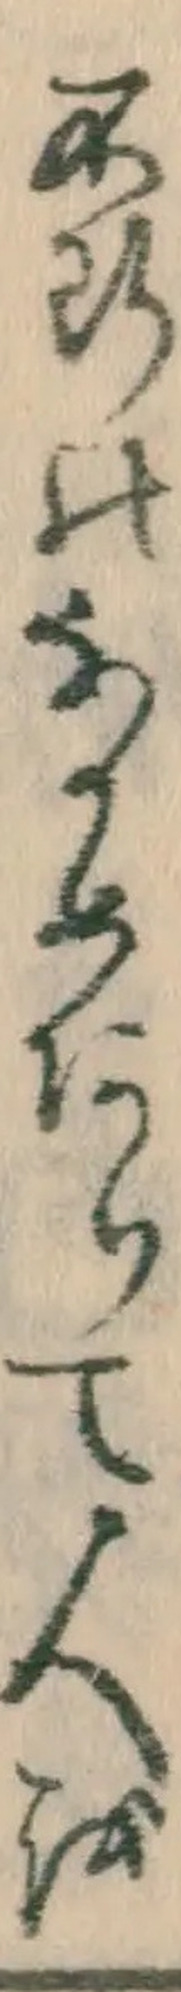不断のなかめありて人を
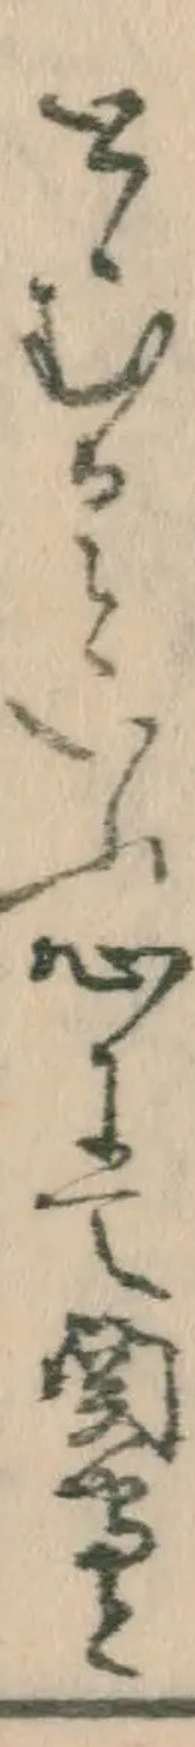とゝむるといふ心にて関守と
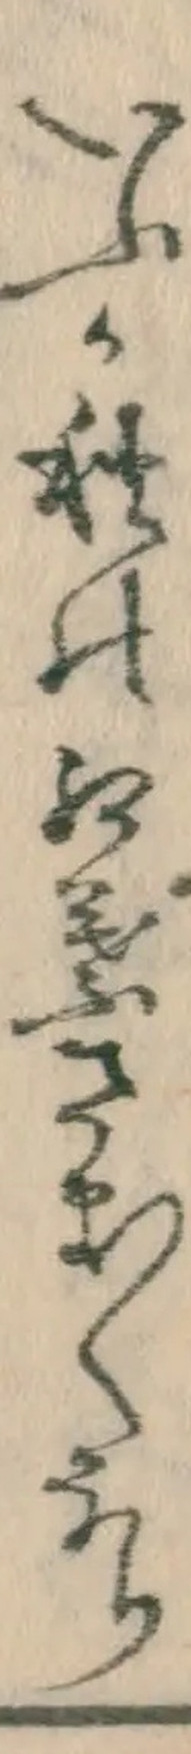いふか秋の紅葉さま〳〵なり
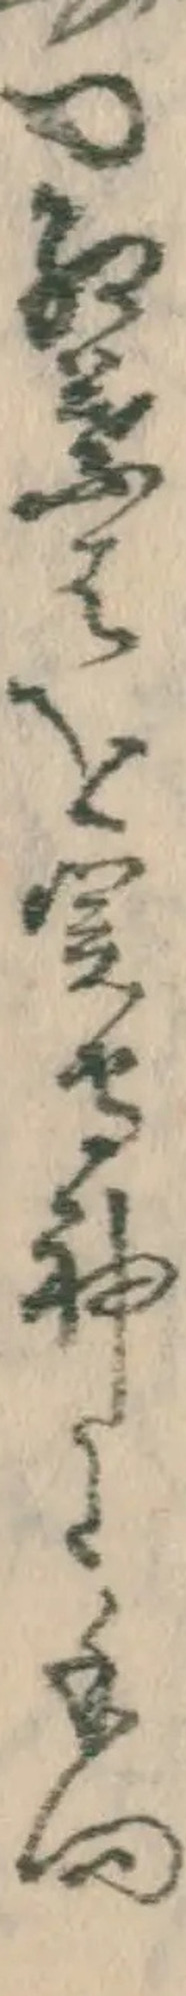○紅葉はを関守神に手向
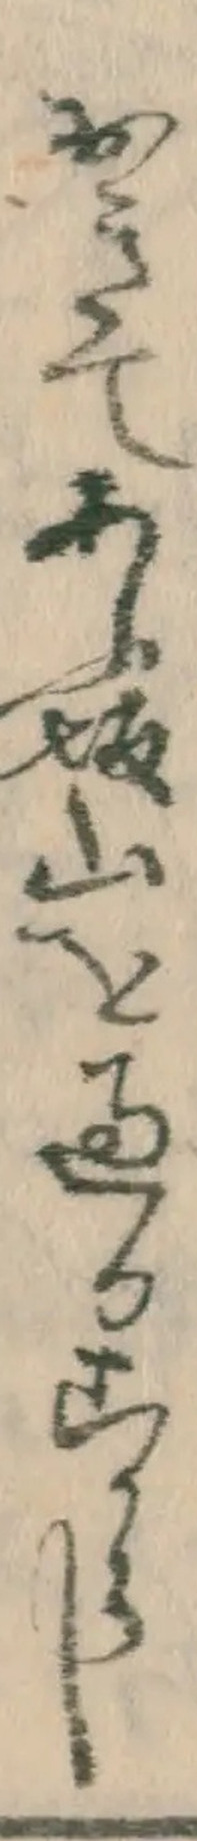おきてあふ坂山を過るこからし
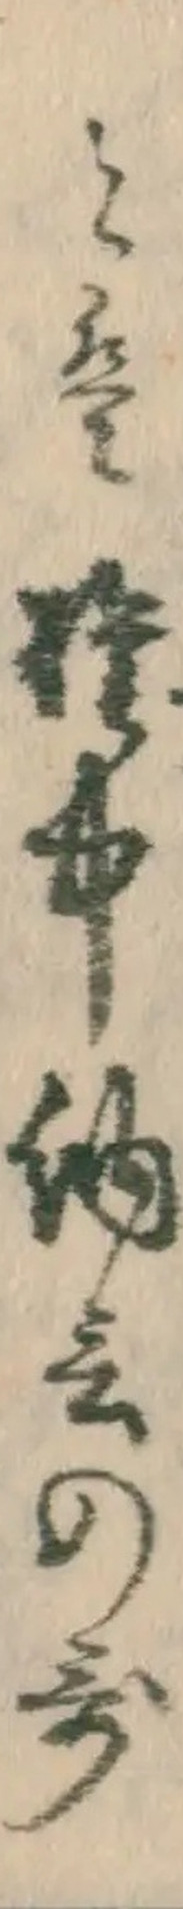とは権中納言の哥
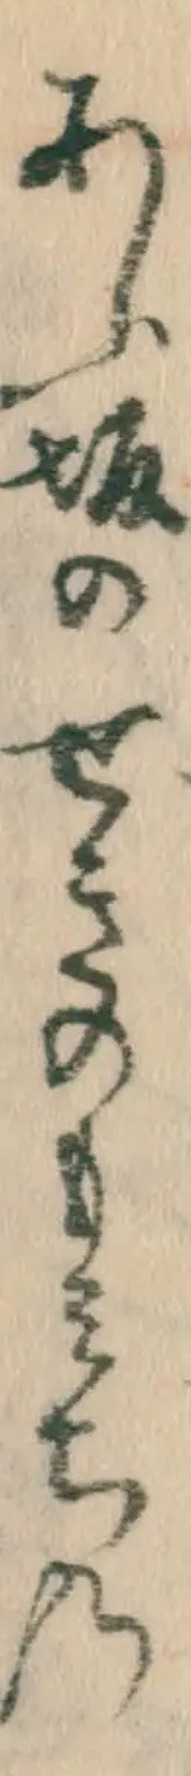あふ坂のせきのもみちの
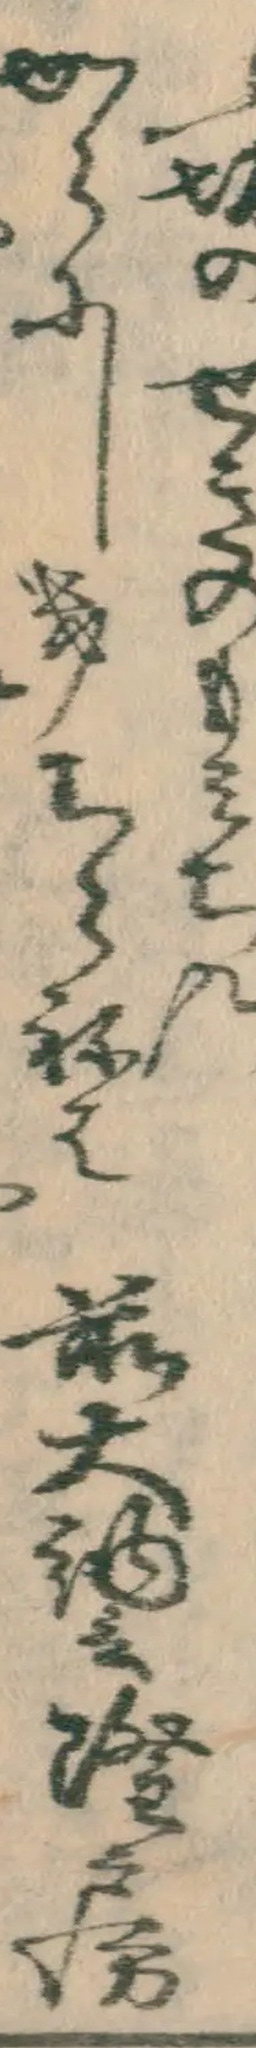からにしきちらねは前大納言隆房
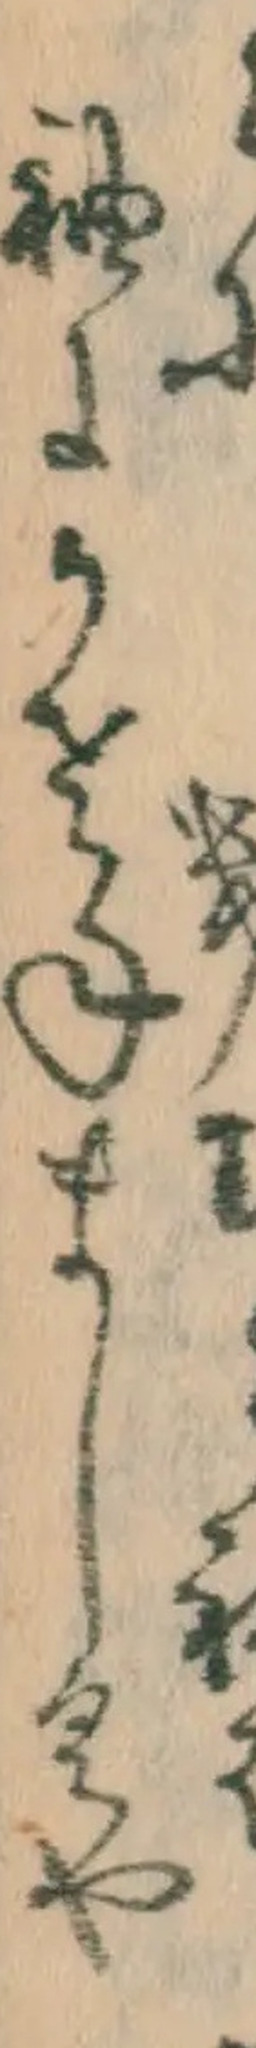袖にかさねましくや

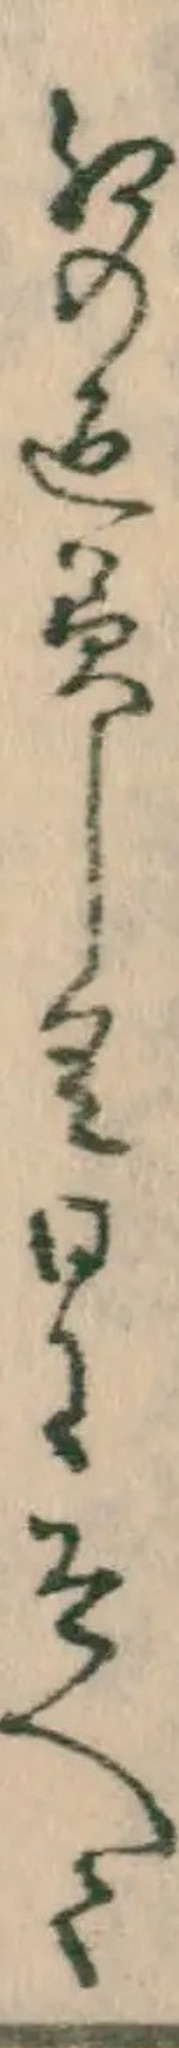紅の色美しく日にそへて
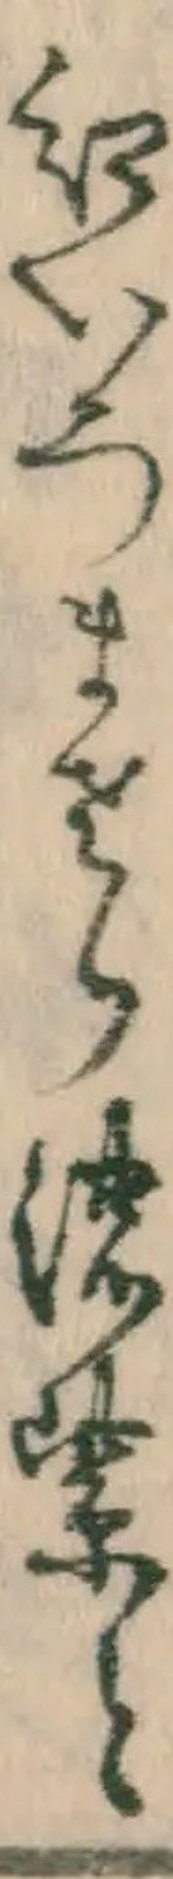紅いろまさり濃紫と
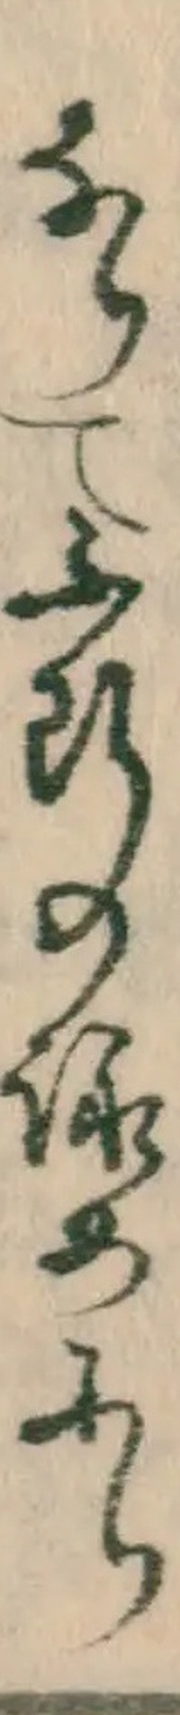なりて不断の詠めあり
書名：紅葉集
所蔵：国立国会図書館 National Diet Library, JAPAN
